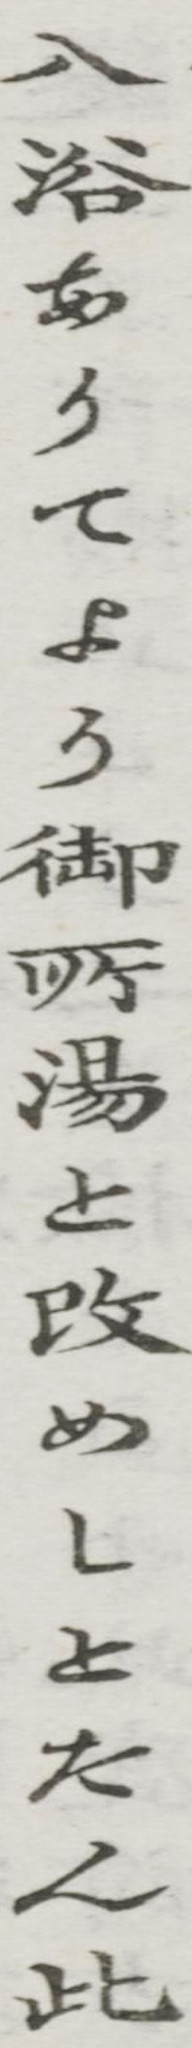入浴ありてより御所湯と改めしとたん此
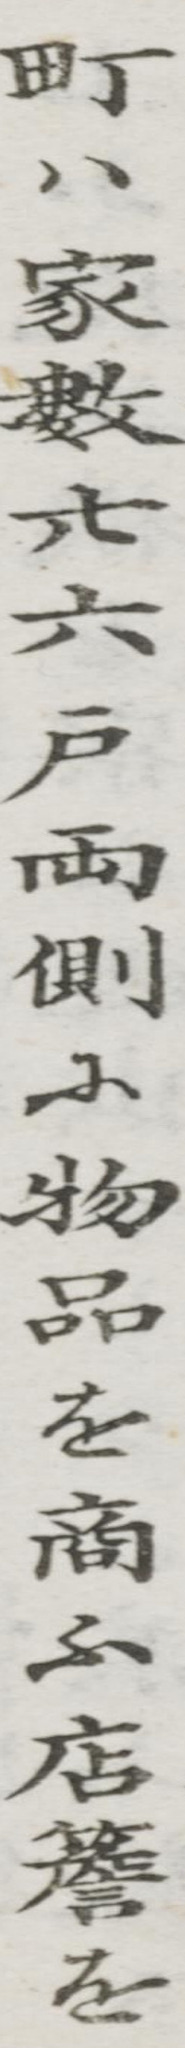町は家数廿六戸両側に物品を商ふ店簷を
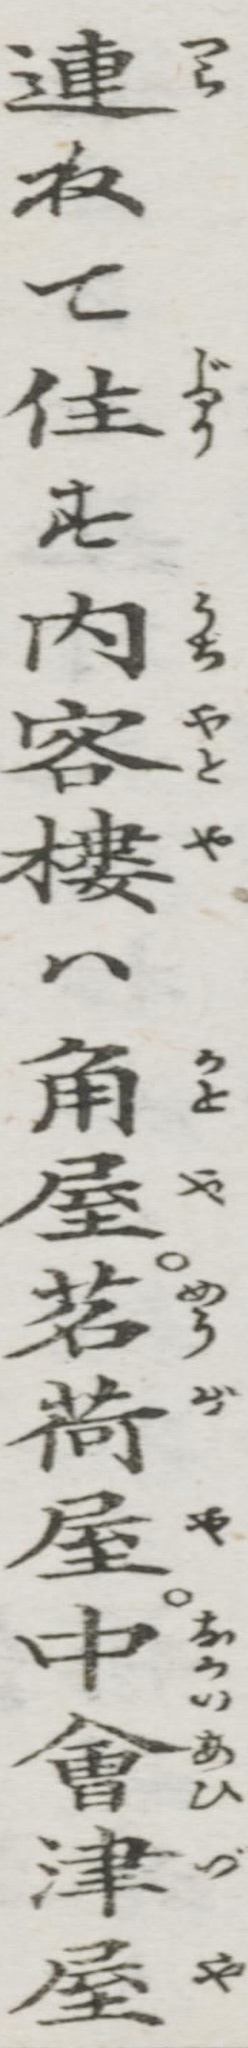連ねて住す内客樓は角屋。茗荷屋。中會津屋
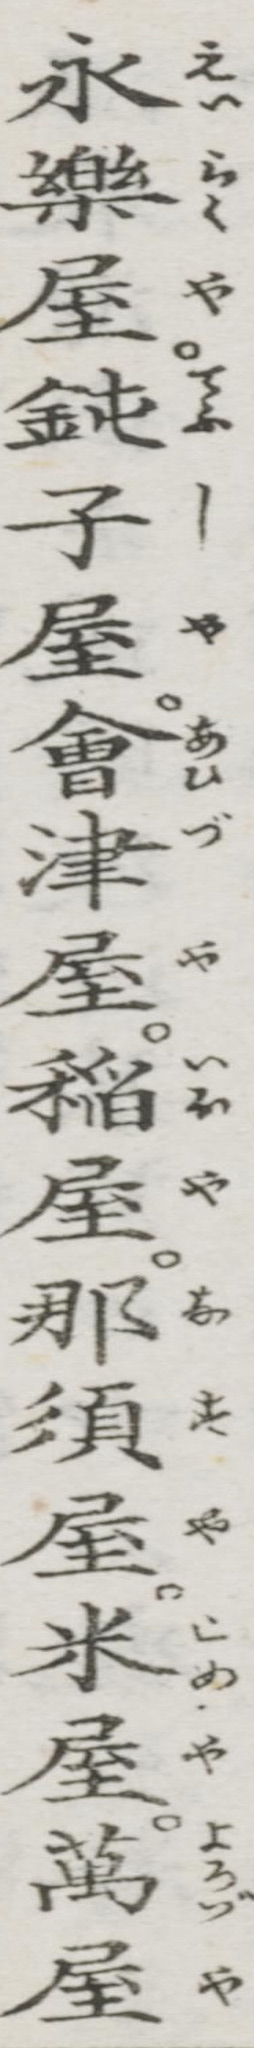永楽屋。鈍子屋。會津屋。稲屋。那須屋。米屋。萬屋
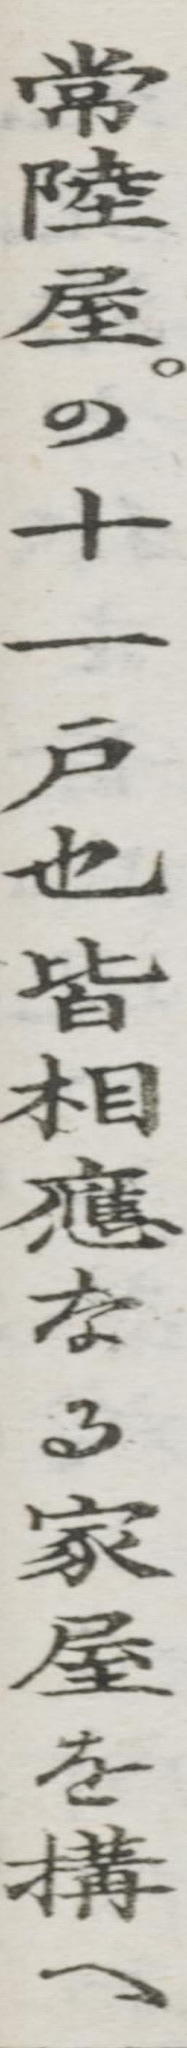常陸屋。の十一戸也皆相応なる家屋を構へ
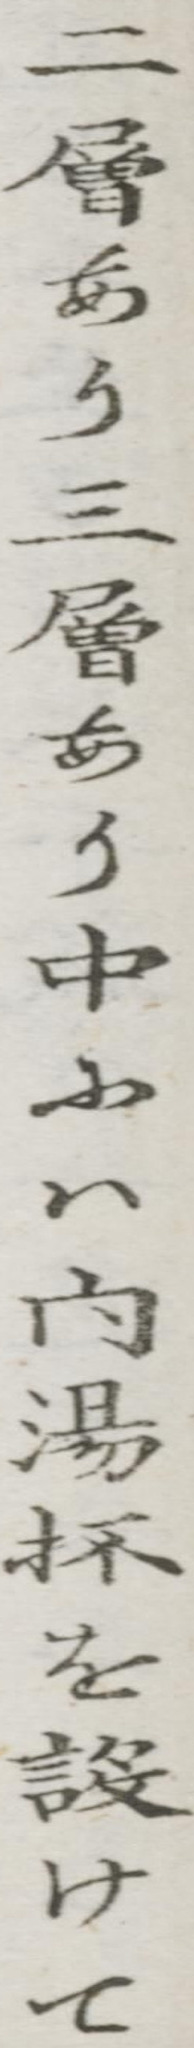二層あり三層あり中には内湯抔を設けて
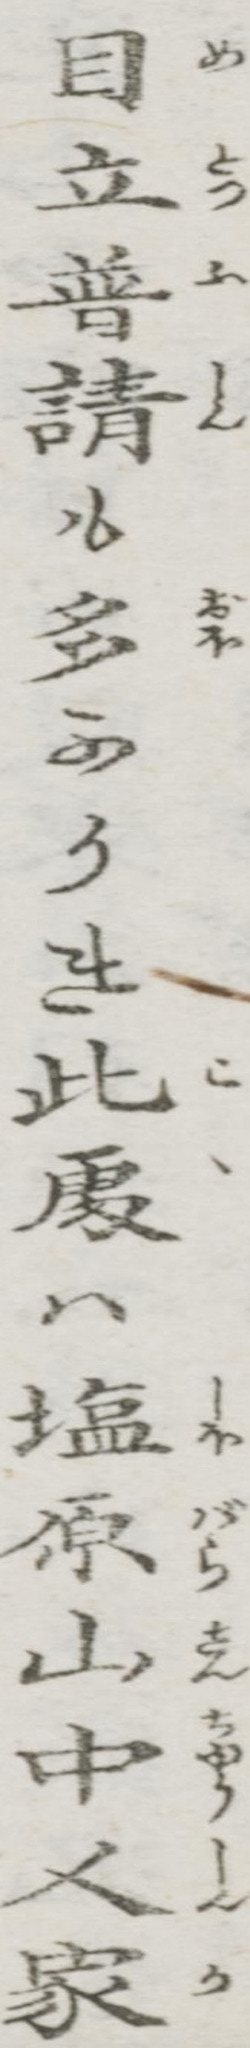目立普請も多かりき此處は塩原山中人家
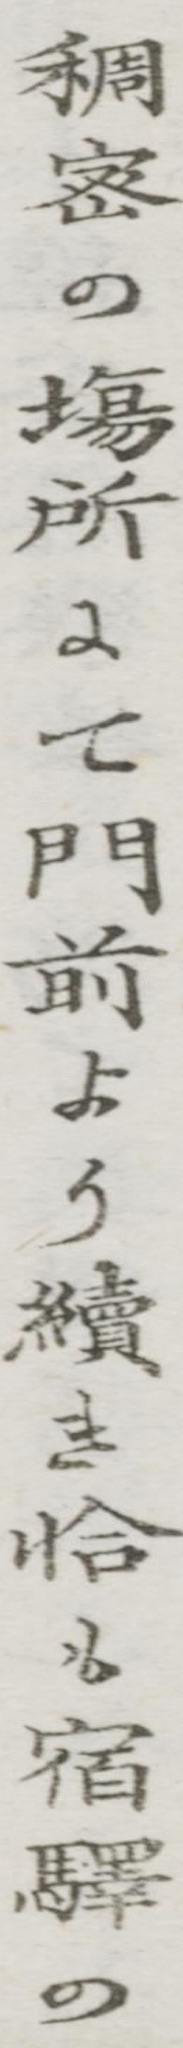稠密の場所にて門前より續き恰も宿驛の
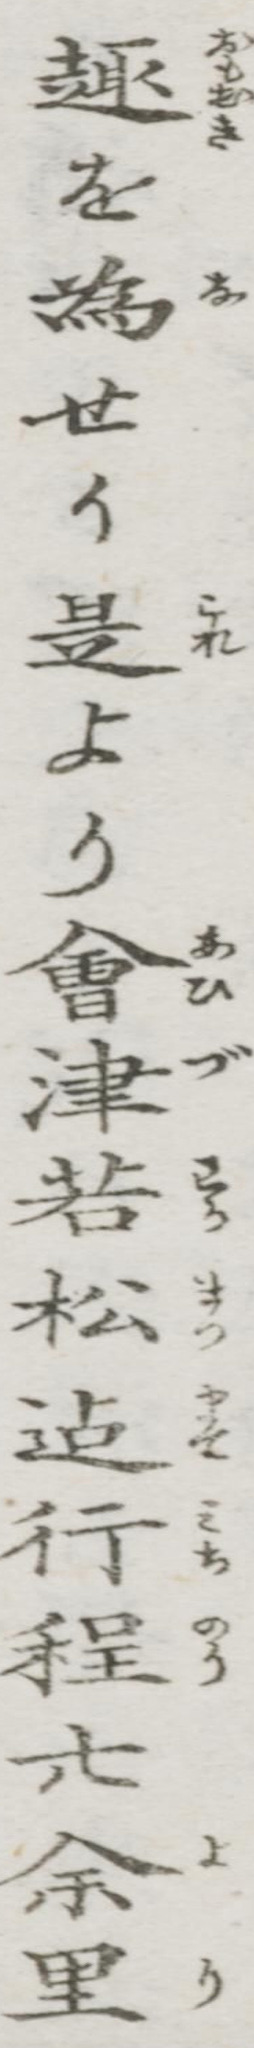趣を為せり是より會津若松迠行程七余里
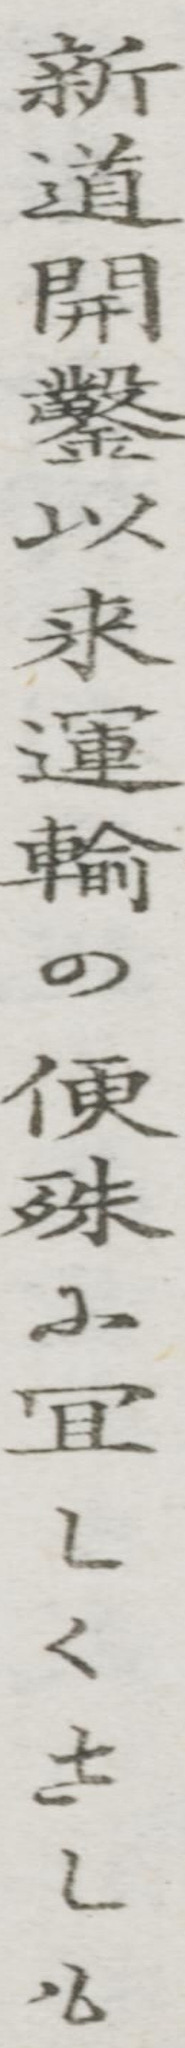新道開鑿以来運輸の便殊に宜しくさしも
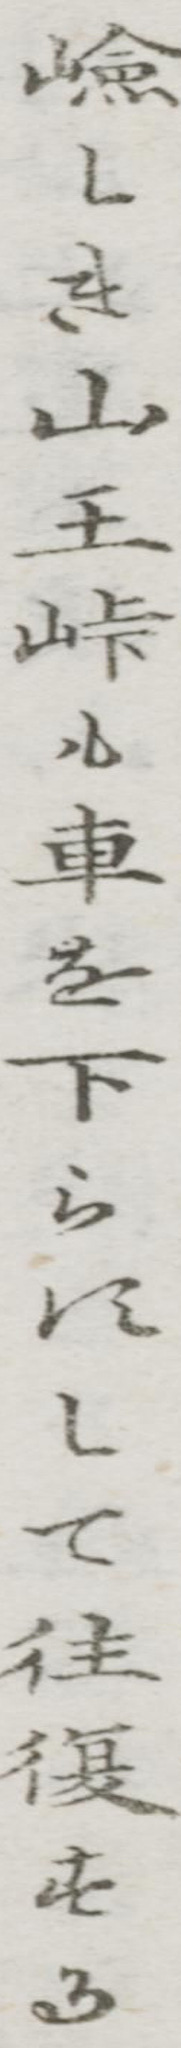嶮しき山王峠も車を下らすして往復する
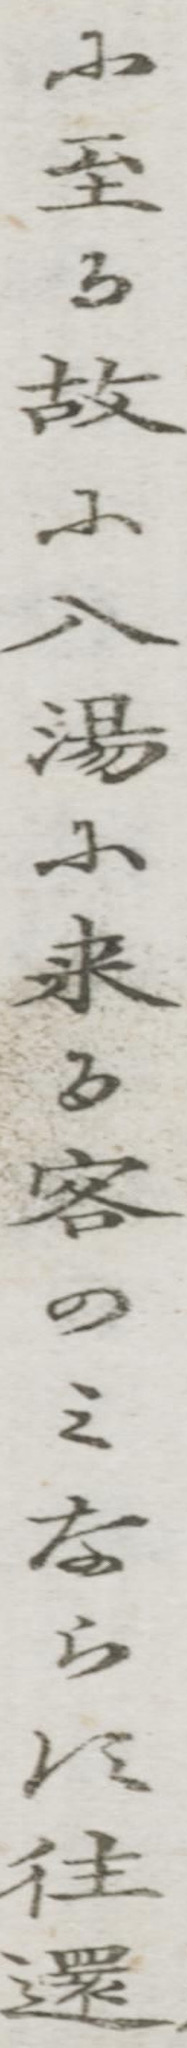に至る故に入湯に来る客のみならす往還
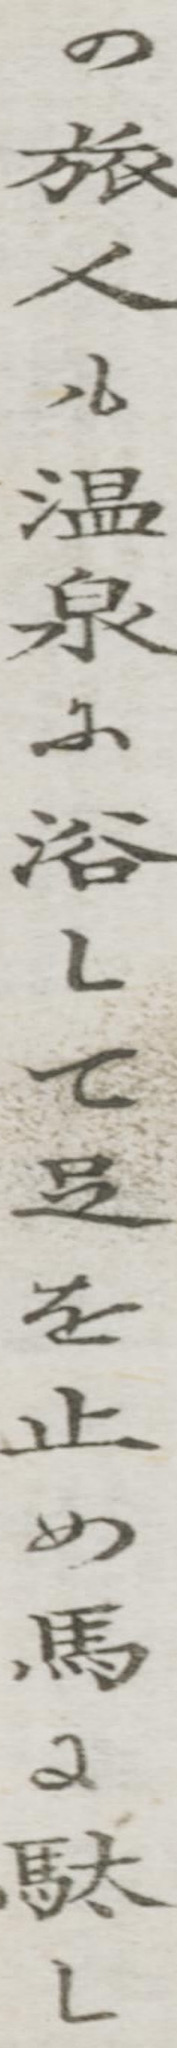の旅人も温泉に浴して足を止め馬に駄し

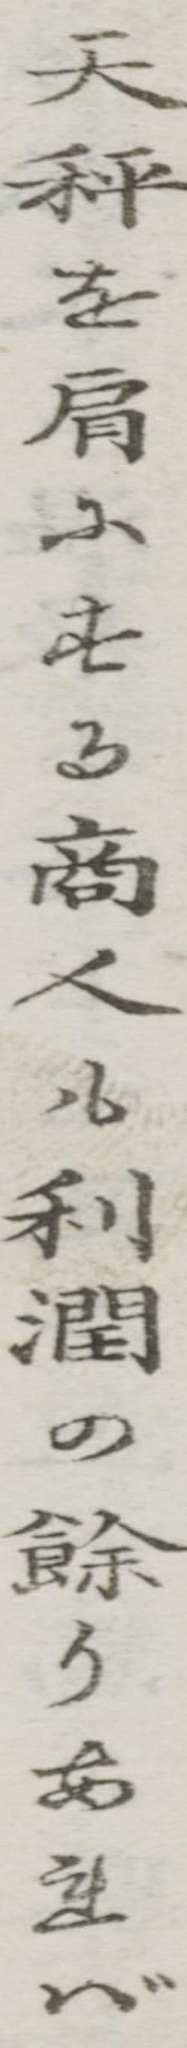天秤を肩にする商人も利潤の餘りあれば
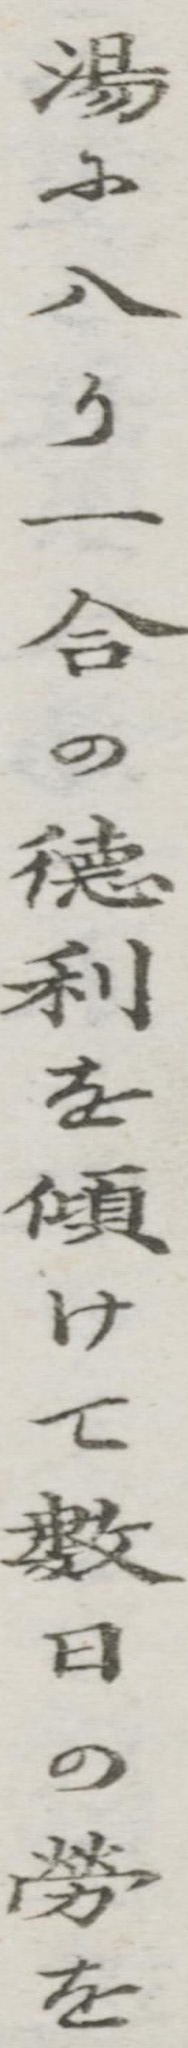湯に入り一合の徳利を傾けて数日の勞を
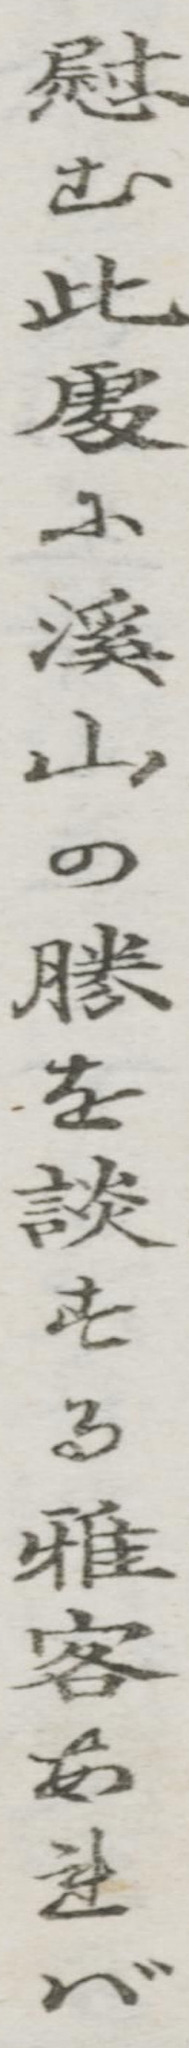慰む此處に溪山の勝を談する雅客あれば
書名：塩原繁昌記　全
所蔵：東京大学地震研究所図書室 Earthquake Research Institute Library, The University of Tokyo, JAPAN
